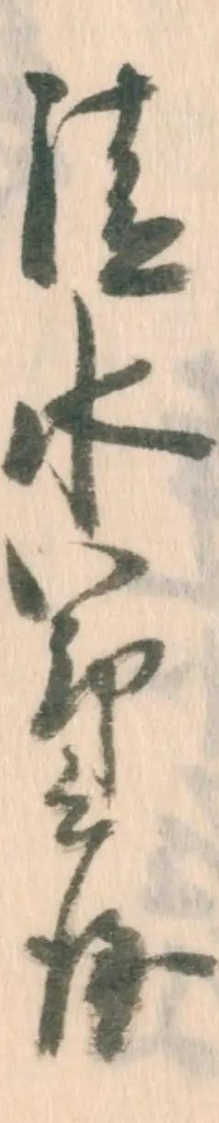清水八郎兵衛
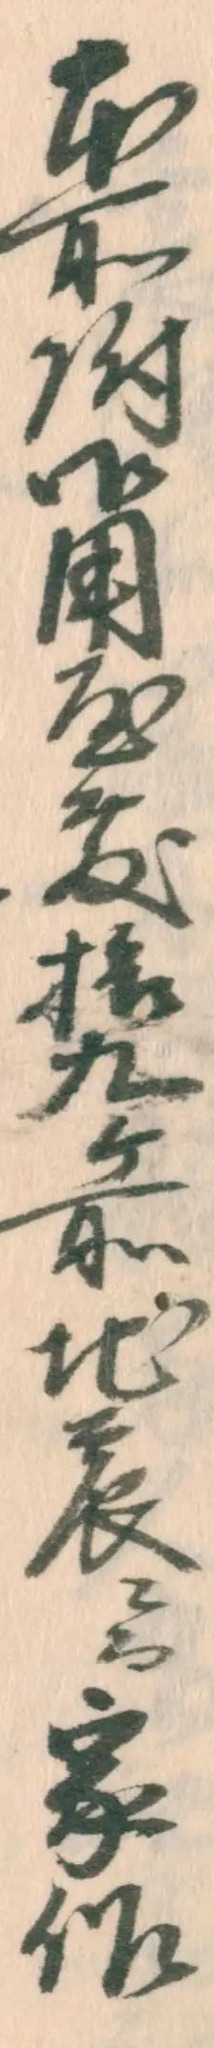本所附御用屋敷拾九ヶ所地震ニ而家作
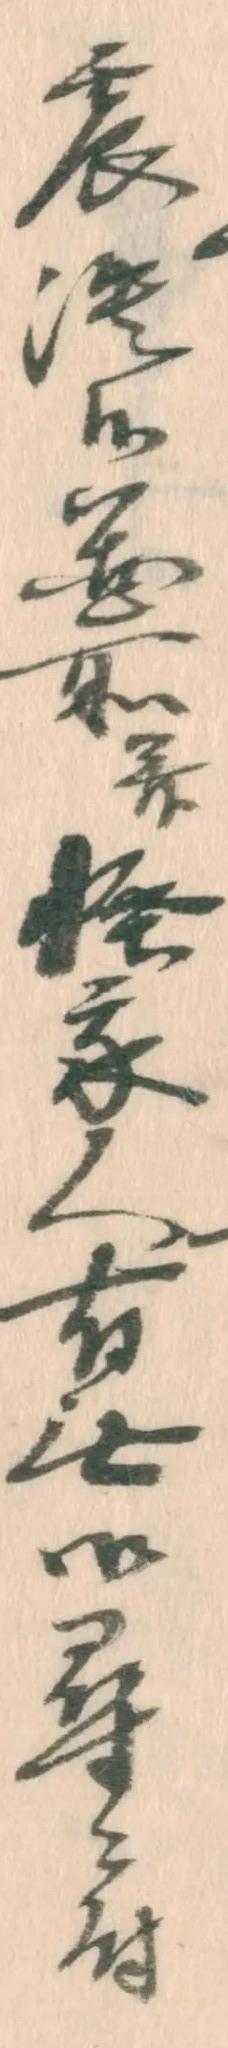震潰候箇所并怪我人有無御尋ニ付
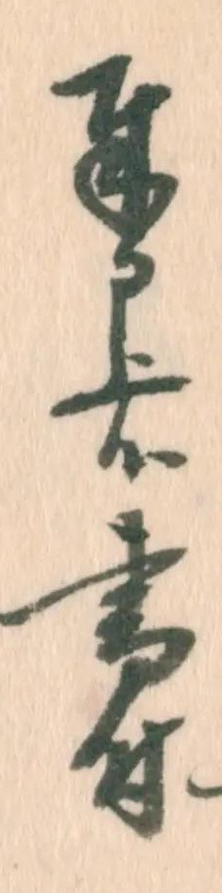奉申上候書付
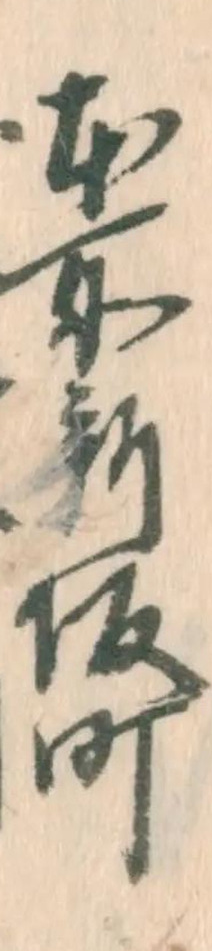本所新坂町
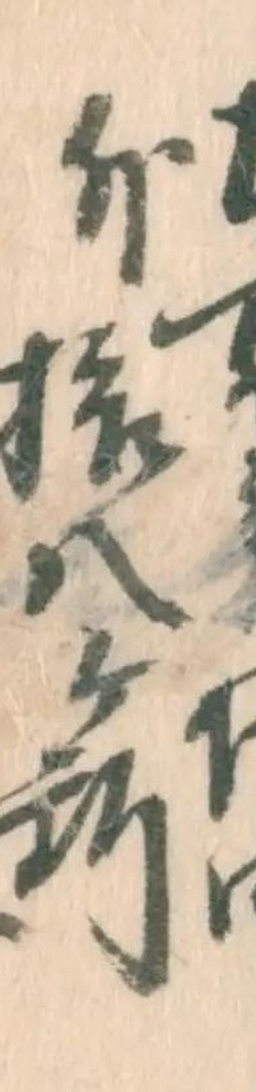外拾八ヶ所
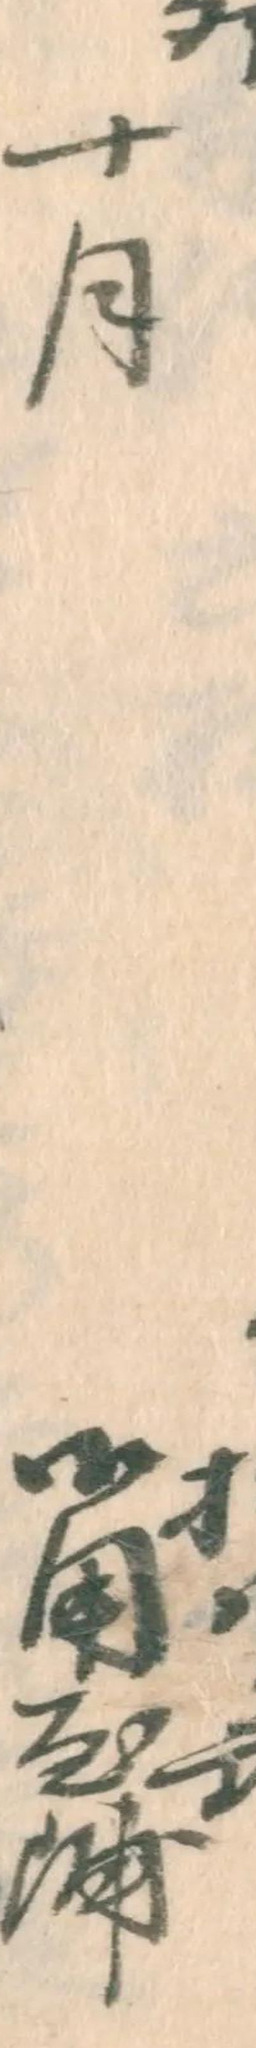卯十月御用屋鋪
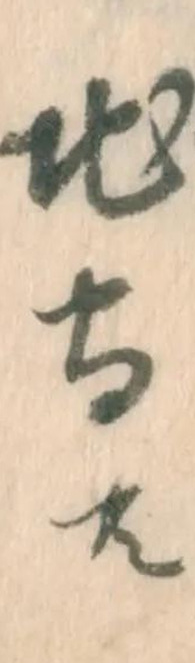地守共

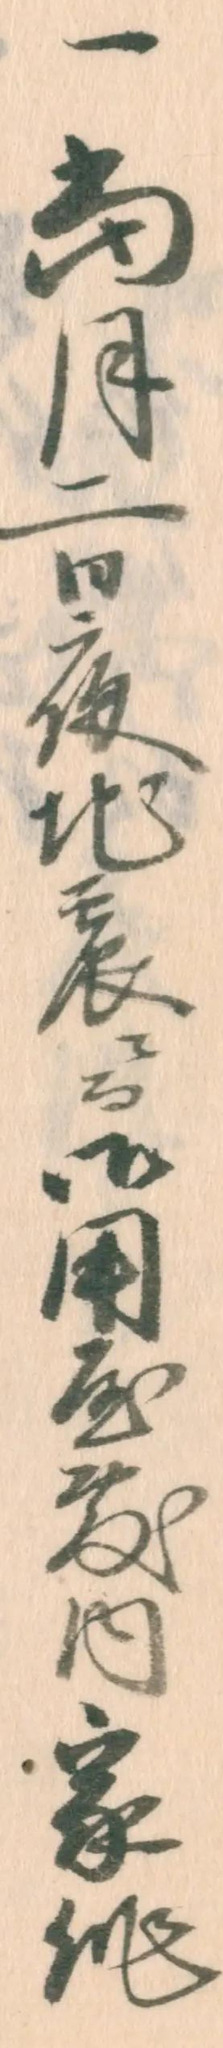一当月二日夜地震ニ而御用屋敷内家作
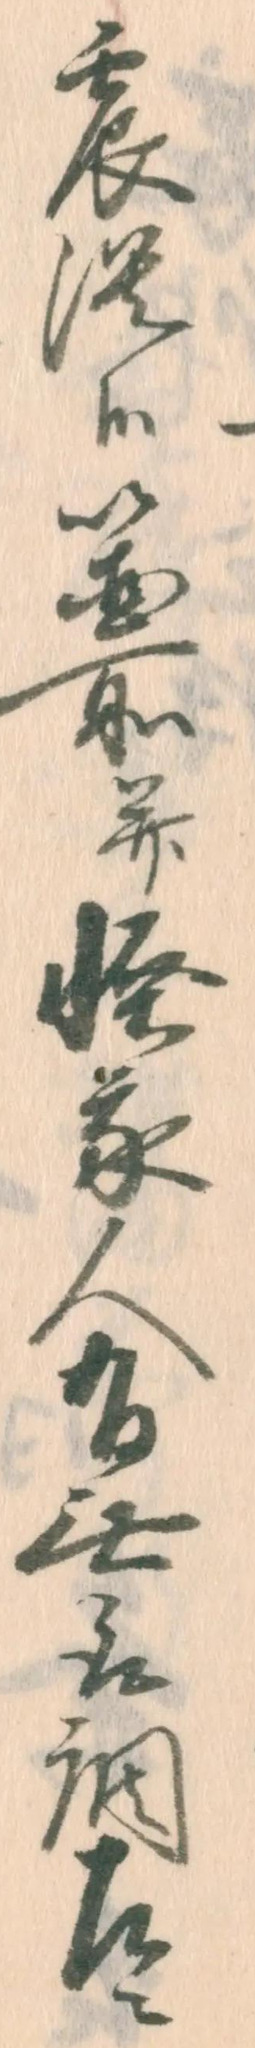震潰候箇所并怪我人有無取調左ニ
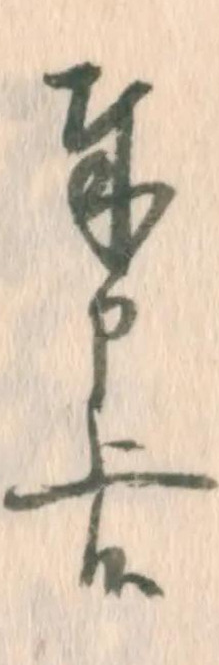奉申上候
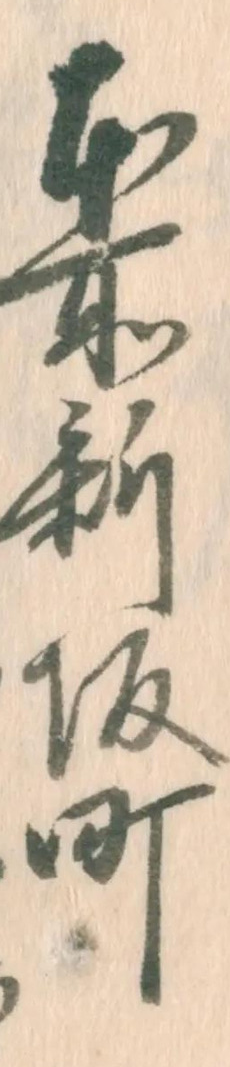本所新坂町
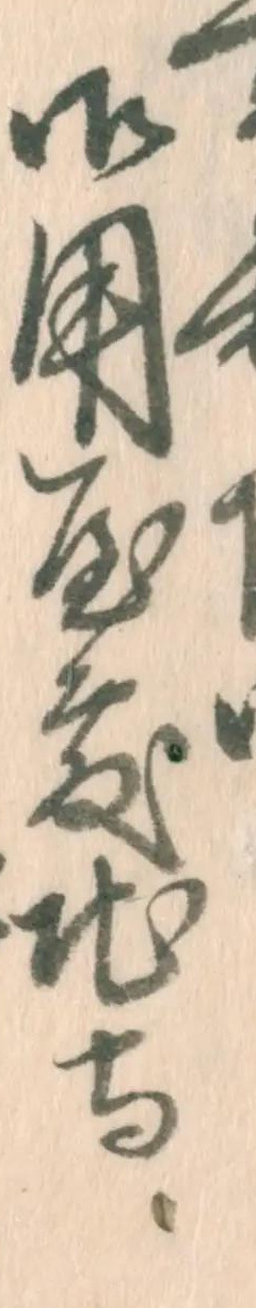御用屋敷地守
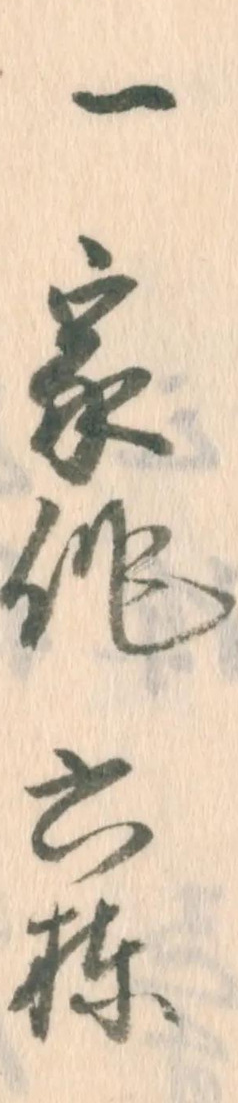一家作六棟
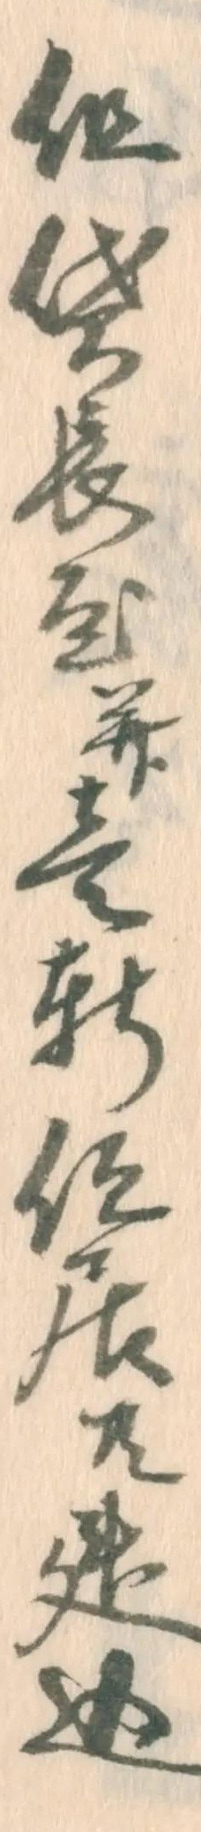但貸長屋并壱軒住居共建込

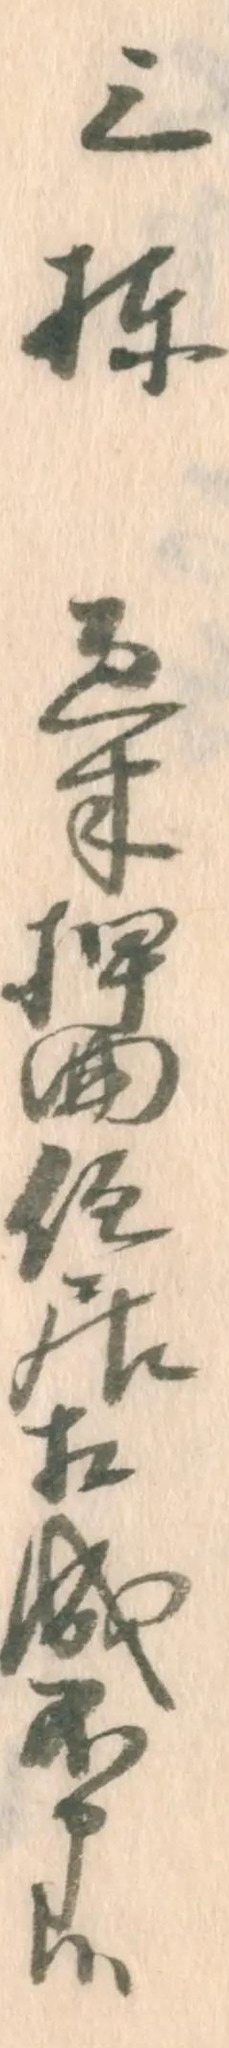三棟過半押曲住居相成不申候
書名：地震災書留 2巻. [1] 内表紙に「地震災書留　安政二卯年　但本所深川御用屋敷地代免除調」とあり
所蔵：国立国会図書館 National Diet Library, JAPAN
